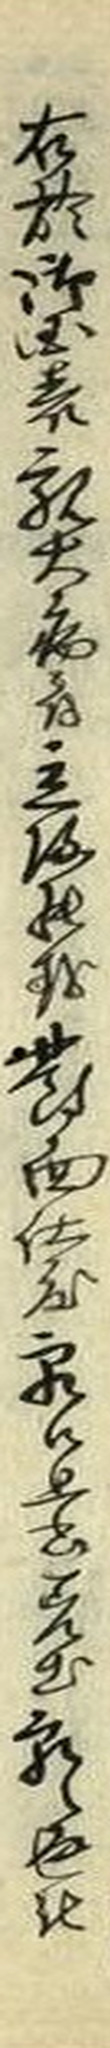右於御国表親大病ニ付立帰罷越対面仕度願口上書差出願之通被
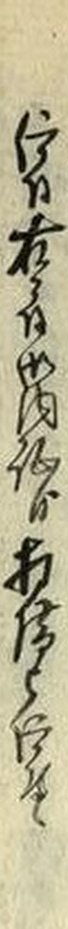仰付右ニ付御内証ゟ拝借被仰付候
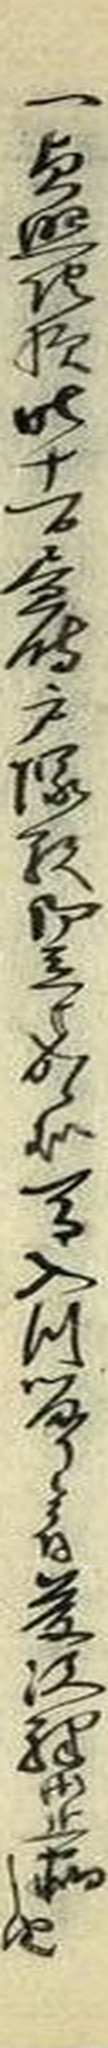一貞照院様昨十一日昼時戸塚駅御立被成候処馬入川留り候ニ付藤沢駅御止宿之由
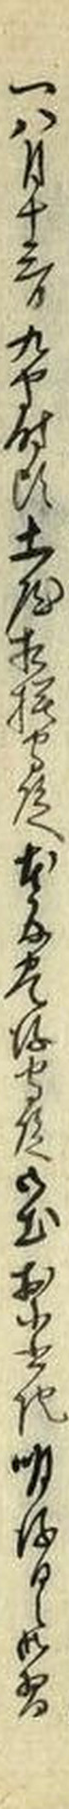一八月十三日九半時頃土屋相模守殿本多豊後守殿御出於小書院明後日之御習
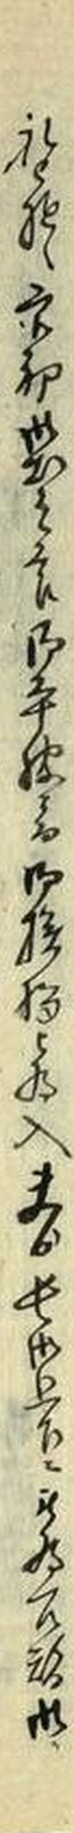礼被遊候最初御出之節御平服ニ而御挨拶被為入夫ゟ長御上下へ被為召替御
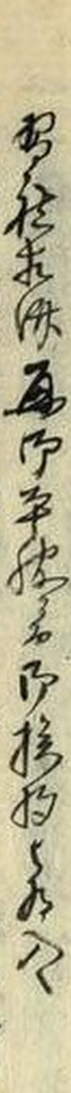習礼相済再御平服ニ而御挨拶被為入候
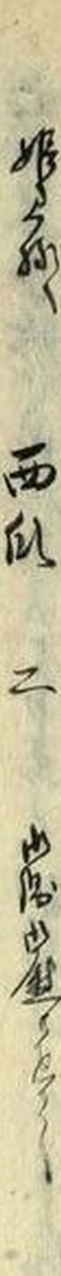姫君様へ西瓜二御側御慰被進之
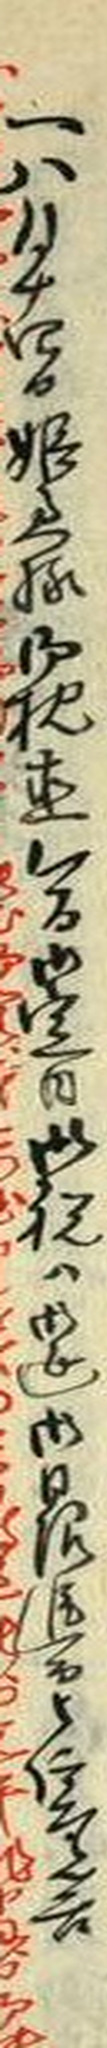一八月十四日姫君様御枕直今日御定日御祝ハ御延御日限追而被仰出候筈
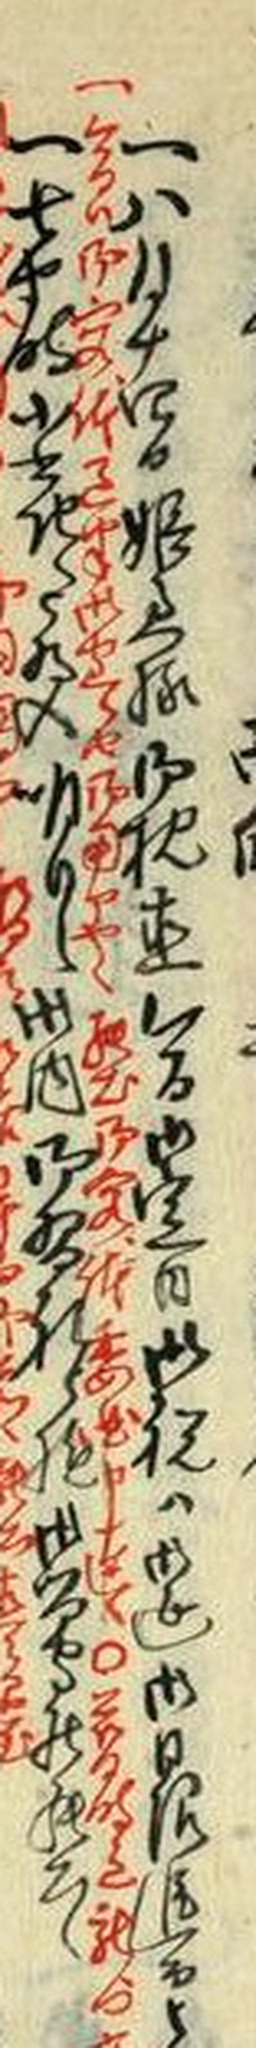一七半時小書院へ被為入明日之御内御習礼被遊御留守居罷出候
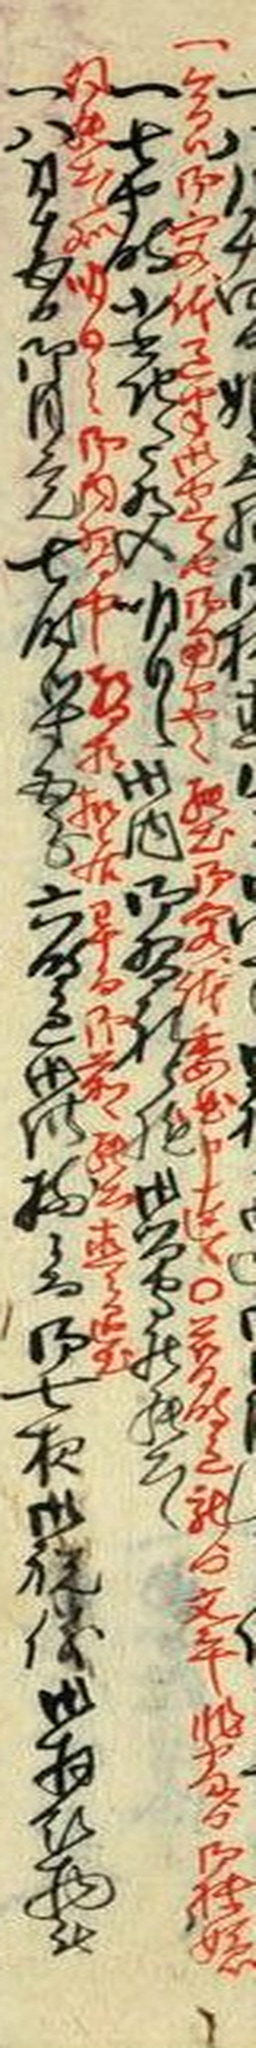一八月十五日御目覚七時弐寸五分六時過御供揃ニ而御七夜御祝儀御拝領物被
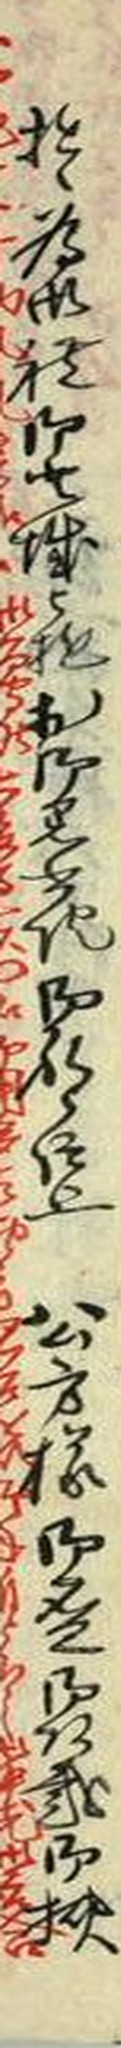遊候為御礼御登城被遊於御黒書院御礼被仰上公方様御盃御頂戴御挟
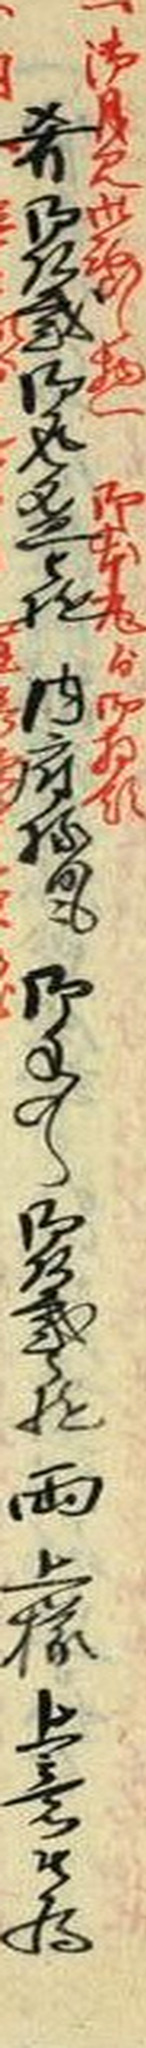肴御頂戴御返盃被遊内府様ゟも御手のし御頂戴被遊両上様上意被為
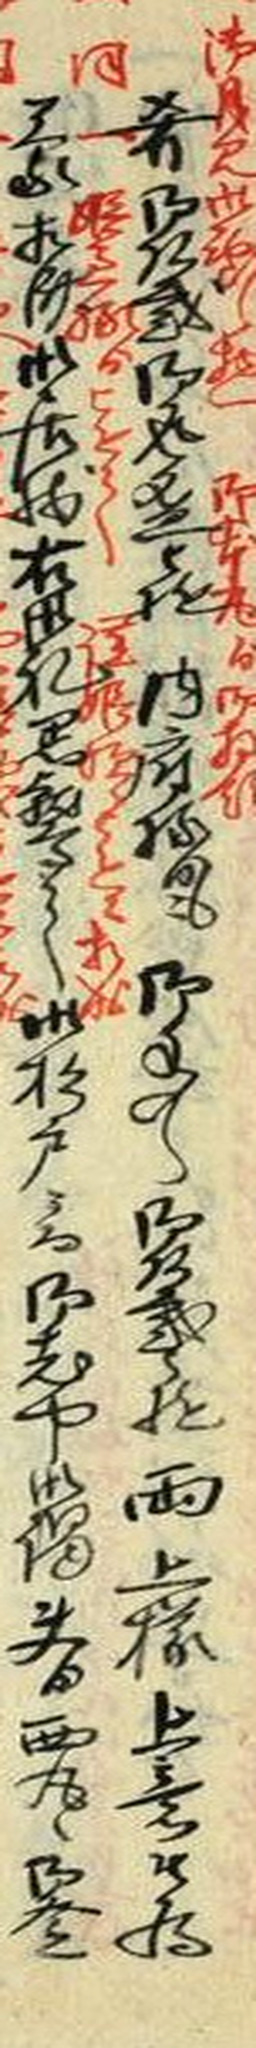蒙相済御居残右御礼黒鷲之御杉戸ニ而御老中御謁夫ゟ西丸御登
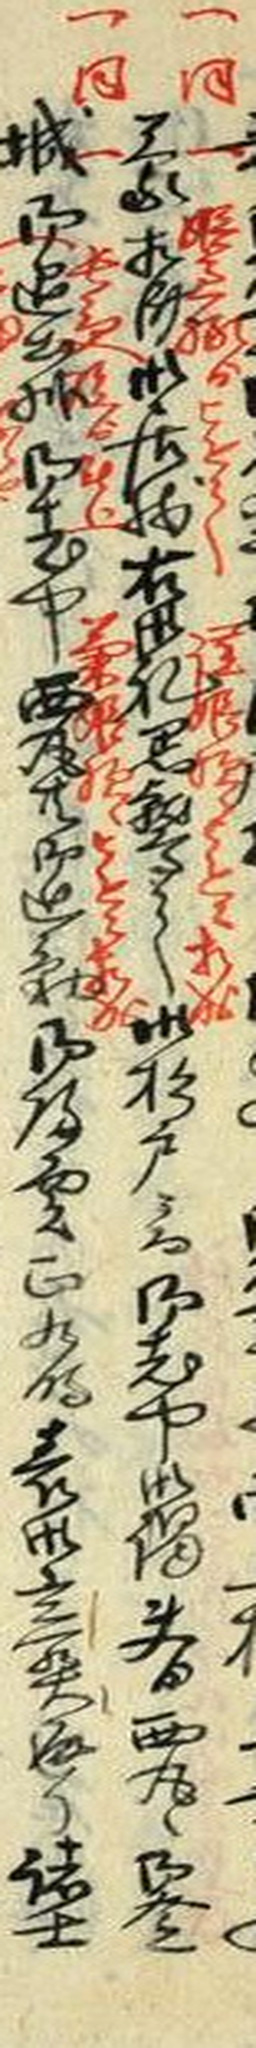城御退出掛御老中西丸共御廻勤御帰殿正九時表御玄関通り諸士
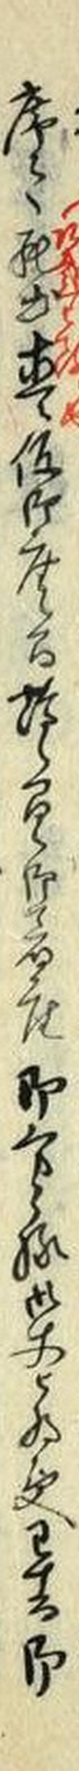席々罷出直ニ仮御座之間鶴之間御着座御方々様御使被為受畢而御
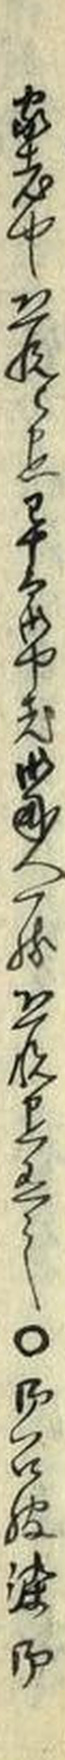家老中恐悦被申上畢而御中老御用人一統恐悦申上有之〇御召服染御
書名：少傅日録抄（斉承付側向頭取日記、在府）
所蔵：福井県文書館 Fukui Prefectural Archives
